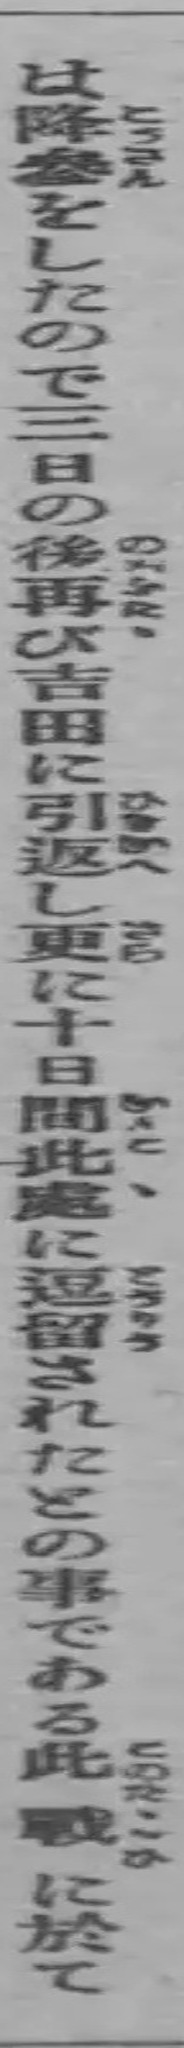は降参をしたので三日の後再び吉田に引返し更に十日間此処に逗留されたとの事である此戦に於て
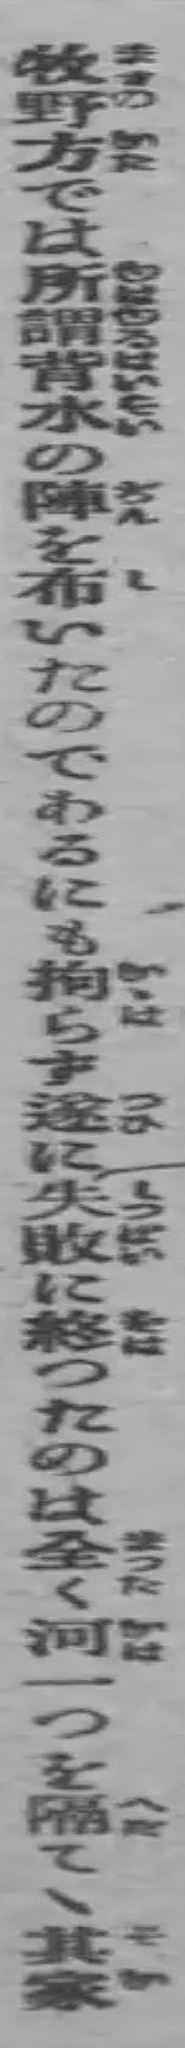牧野方では所謂背水の陣を布いたのであるにも拘らず遂に失敗に終つたのは全く河一つを隔てゝ其家
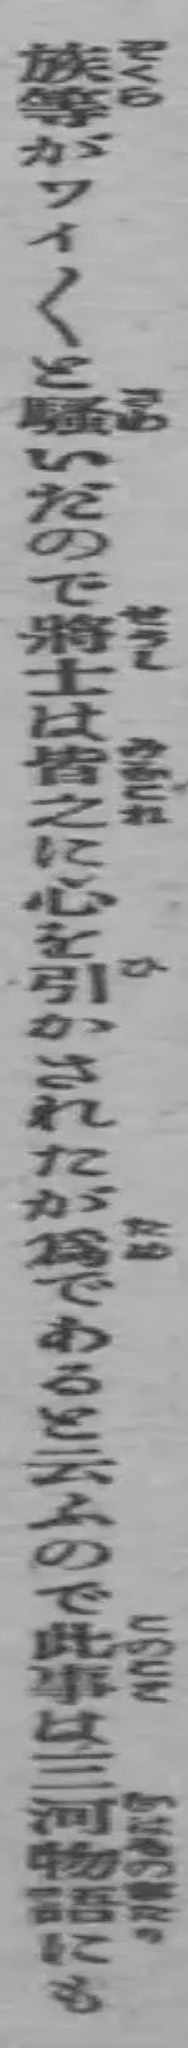族等がワイ〳〵と騒いだので将士は皆之に心を引かされたが為であると云ふので此事は三河物語にも
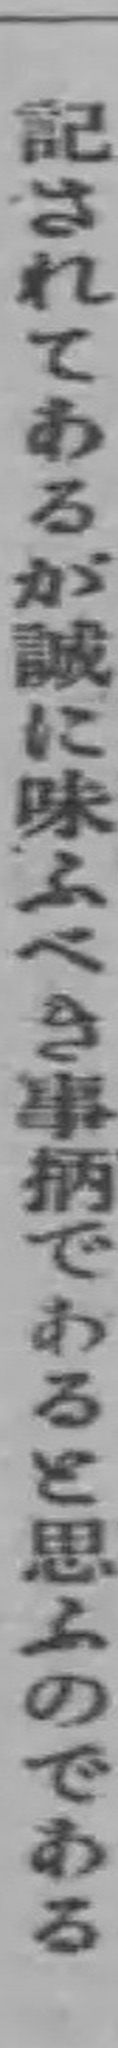記されてあるが誠に味ふべき事柄であると思ふのである
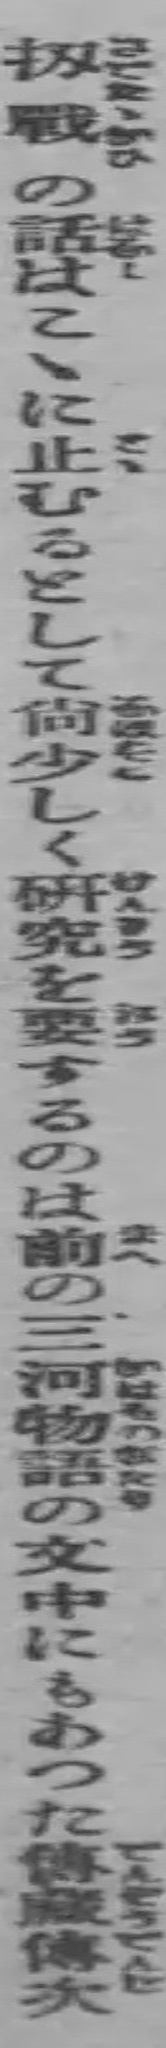扨戦の話はこゝに止むるとして尚少しく研究を要するのは前の三河物語の文中にもあつた傳蔵傳次
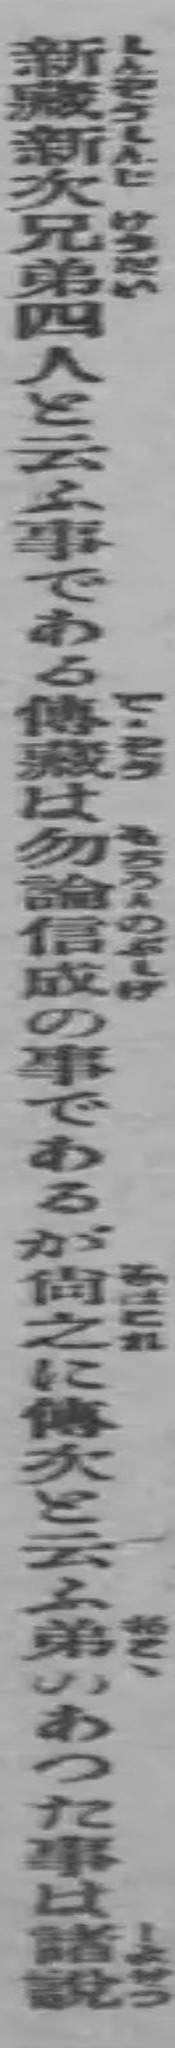新蔵新次新蔵新次兄弟四人と云ふ事である傳蔵は勿論信成の事であるが尚之に傳次と云ふ弟のあつた事は諸説
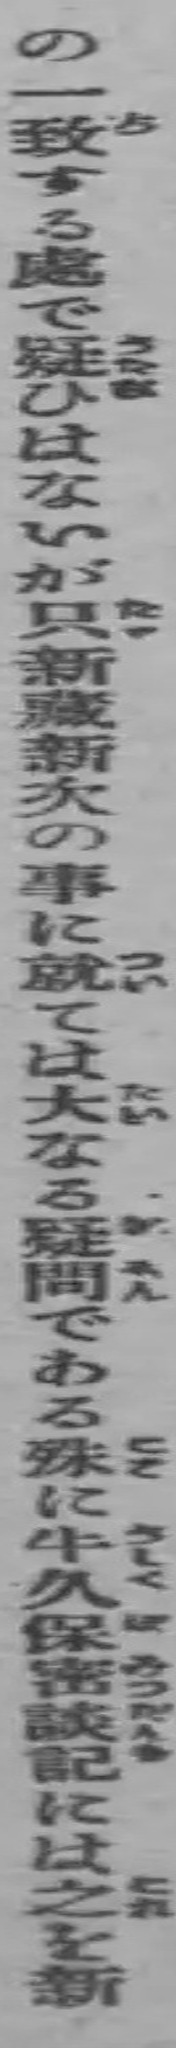の一致する処で疑ひはないが只新蔵新次の事に就ては大なる疑問である殊に牛久保密談記には之を新
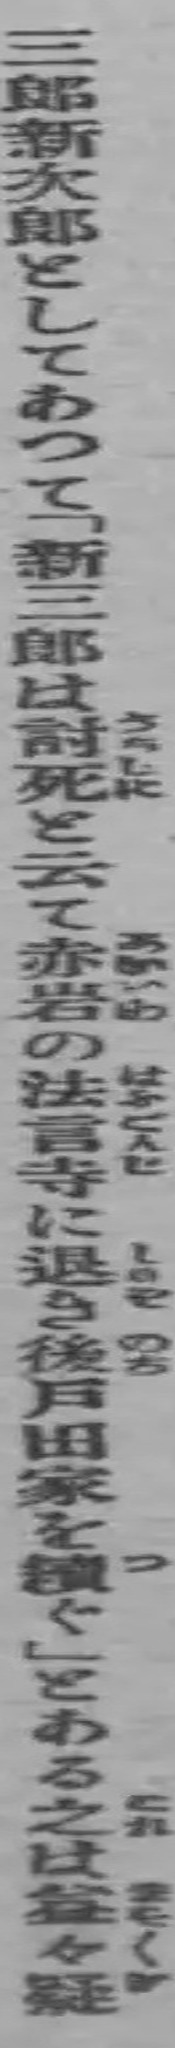三郎新次郎としてあつて「新三郎は討死と云て赤岩の法言寺に退き後戸田家を続ぐ」とある之は益々疑
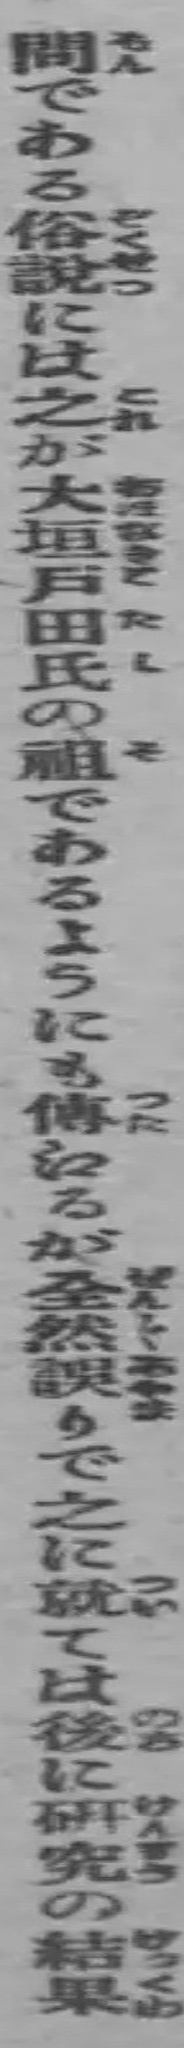問である俗説には之が大垣戸田氏の祖であるようにも伝えるが全然誤りで之に就ては後に研究の結果
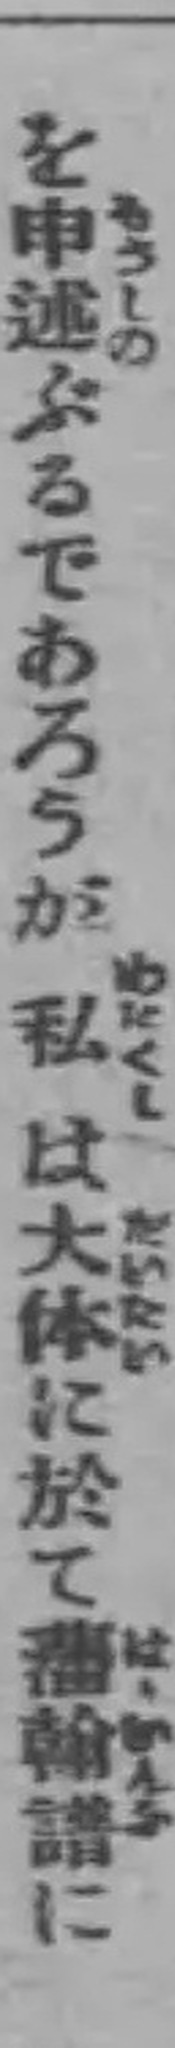を申述ぶるであろうが私は大体に於て藩翰譜に
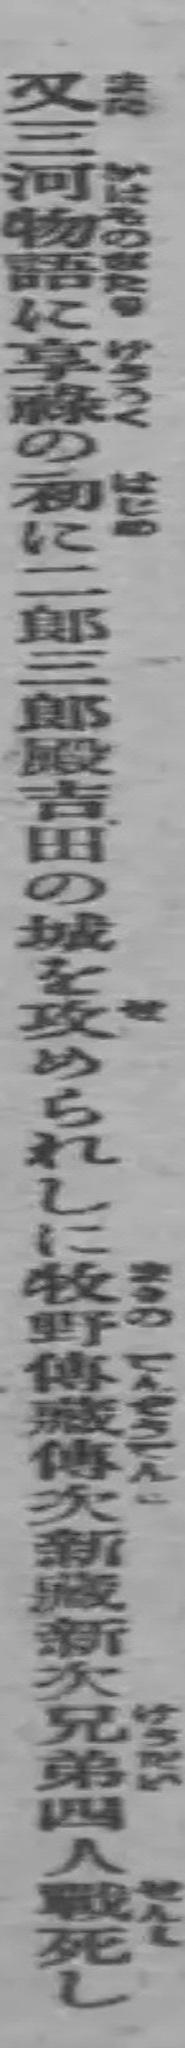又三河物語に享禄の初に二郎三郎殿吉田の城を攻められしに牧野傳蔵傳次新蔵新次兄弟四人戦死し
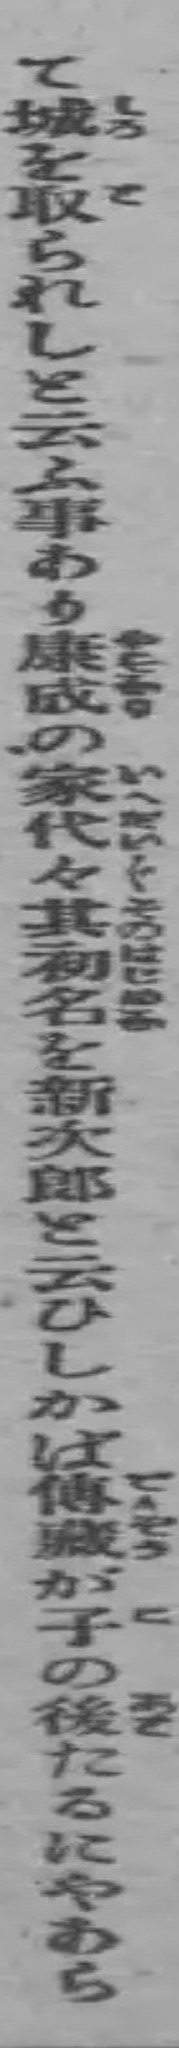て城を取られしと云ふ事あり康成の家代々其初名を新次郎と云ひしかば傳蔵が子の後たるにやあら
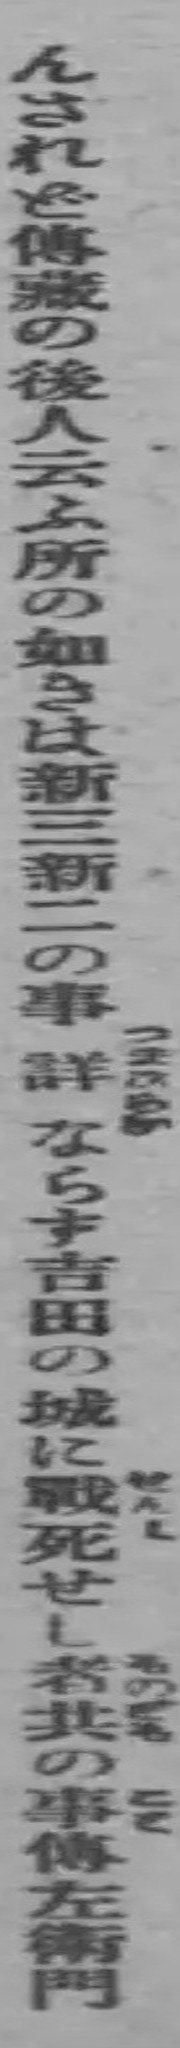んされど傳蔵の後人云ふ所の如きは新三新二の事詳ならず吉田の城に戦死せし者共の事傳左衛門
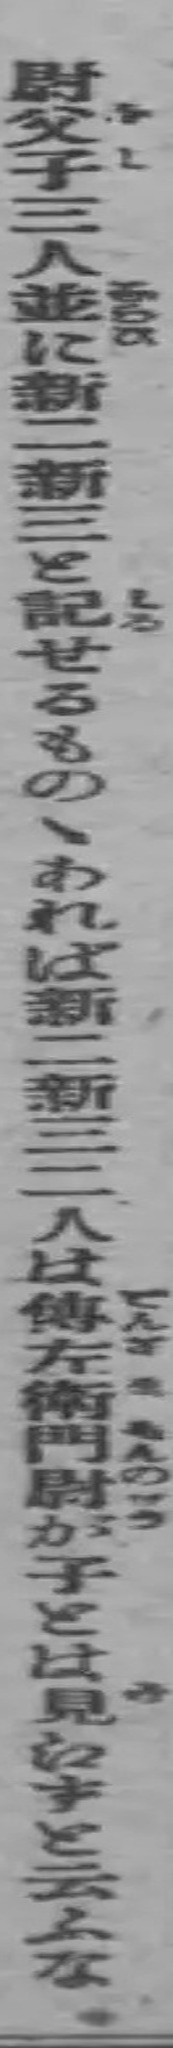尉父子三人並に新二新三と記せるものゝあれば新二新三二人は傳左衛門尉が子とは見えずと云ふな
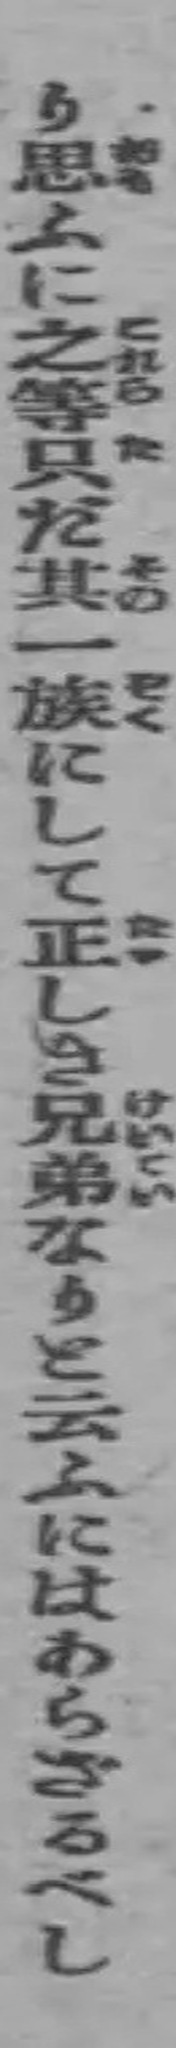り思ふに之等只だ其一族にして正しき兄弟なりと云ふにはあらざるべし
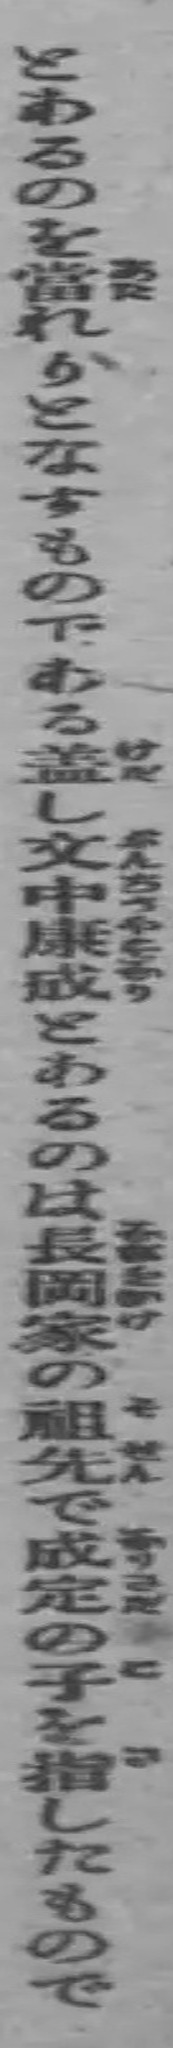とあるのを当れりとなすものである蓋し文中康成とあるのは長岡家の祖先で成定の子を指したもので
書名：豊橋市史談
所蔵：国立国会図書館 National Diet Library, JAPAN
